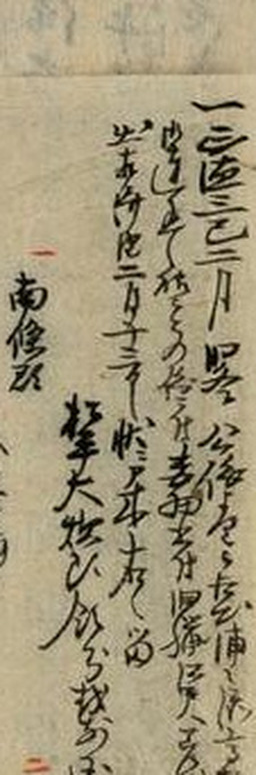出相済由二月十三日之状ニ申来右之留
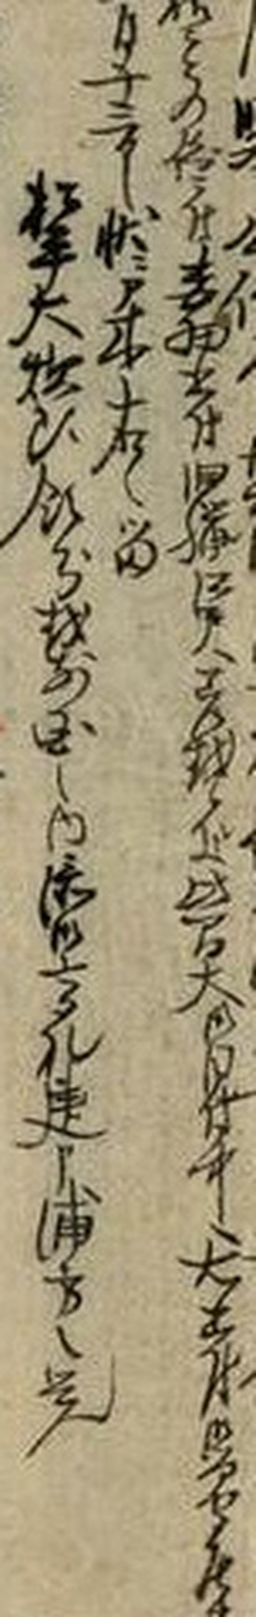松平大炊頭領分越前国之内添御高札建申浦方之覚
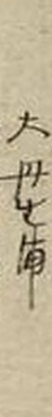大丹生浦
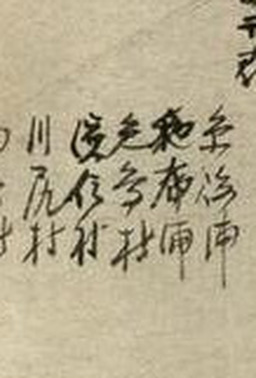免鳥村
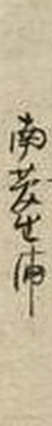南菅生浦
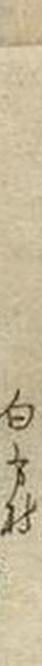白方村
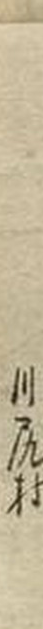川尻村
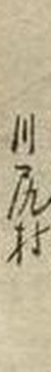川尻村
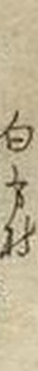白方村
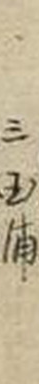三国浦
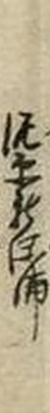泥原新保浦
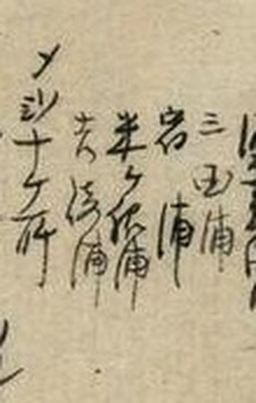米ケ脇浦
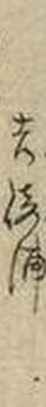吉崎浦
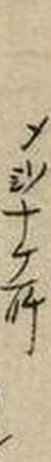〆弐十ケ所
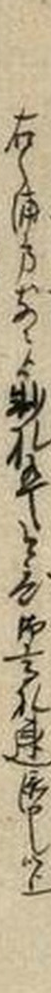右之浦方前々ゟ制札有之今度御高札建添申候以上
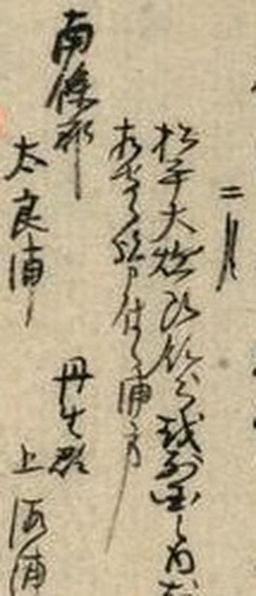相守候様申付候浦方
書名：御国他国諸事之部
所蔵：福井県文書館 Fukui Prefectural Archives
